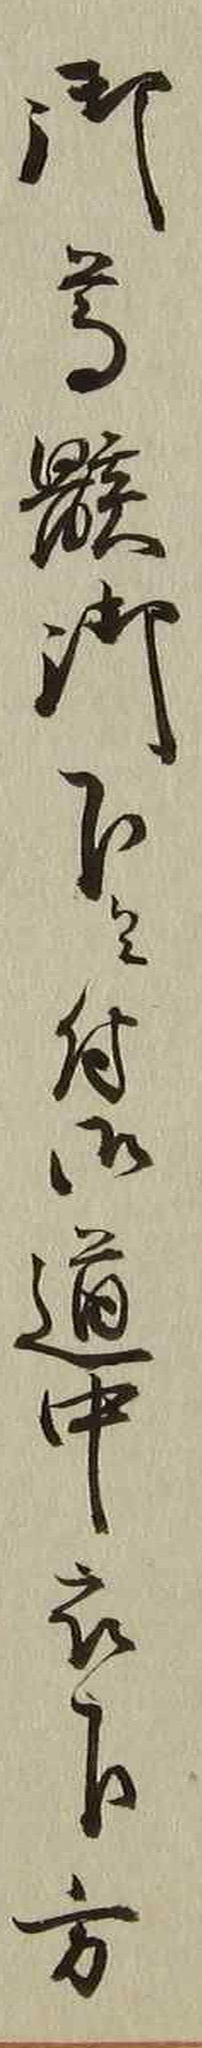御尊骸御下りニ付御道中被下方
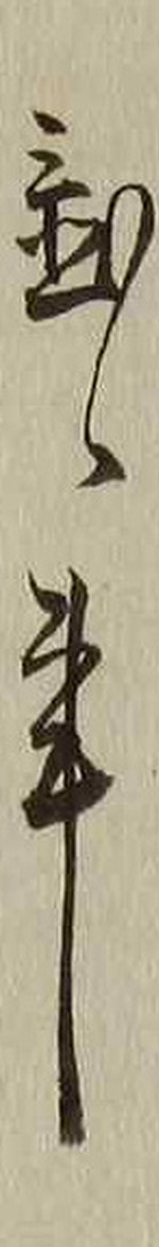置候事
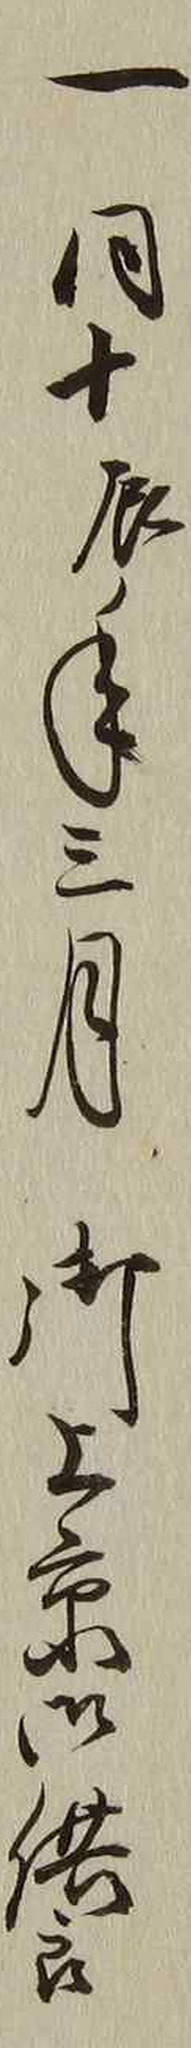一同十辰年三月御上京御供被
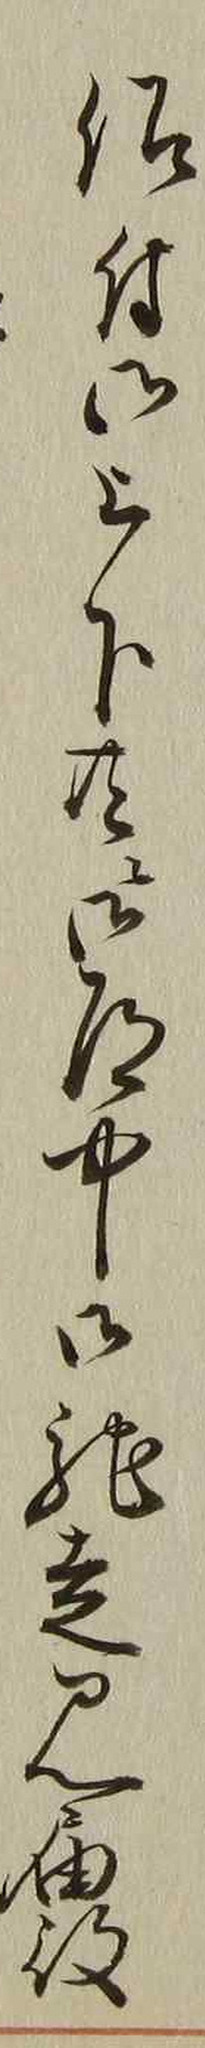仰付御上下共ニ御道中御馳走見届役
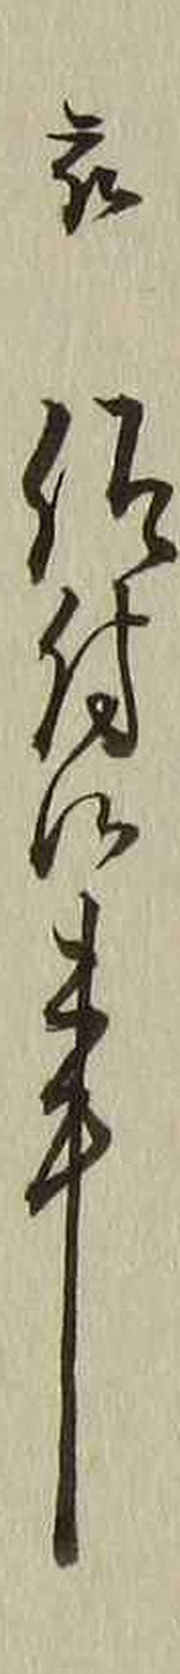被仰付候事
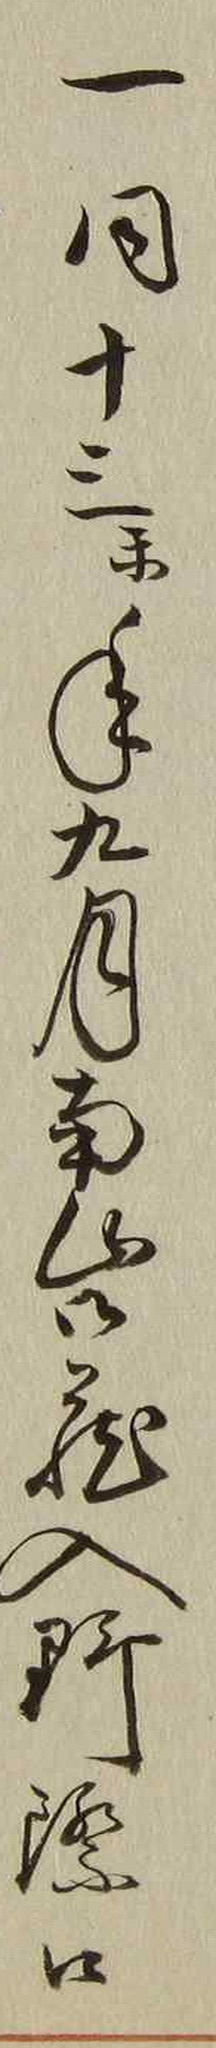一同十三未年九月南山御蔵入野際口
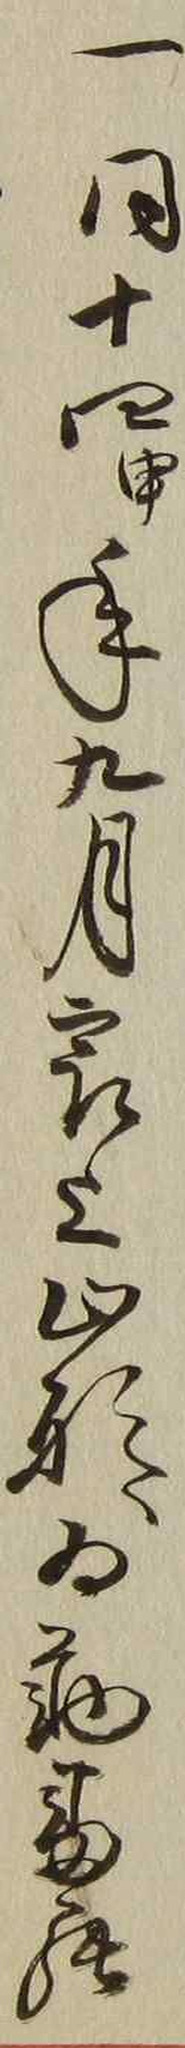一同十四甲年九月最上山形為勤番罷
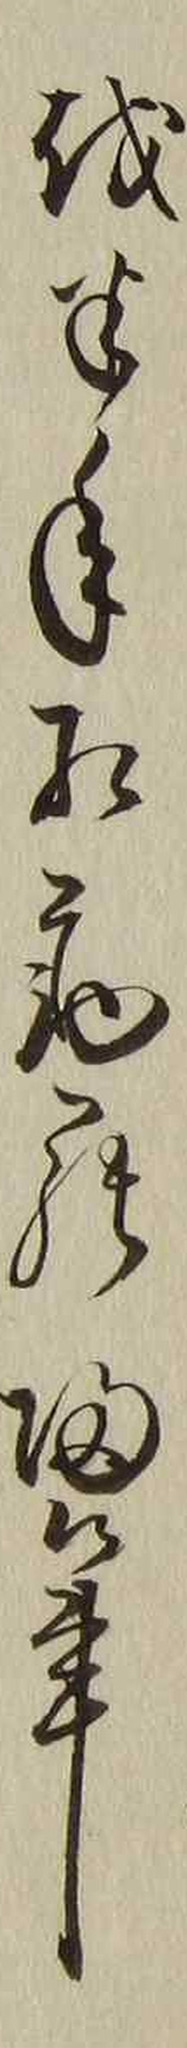越半年相勤罷帰候事
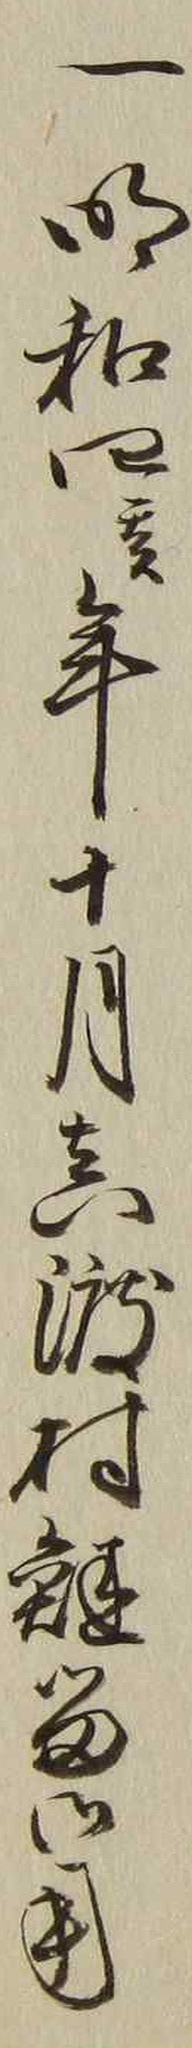一明和四亥年十月真渡村鮭留御用

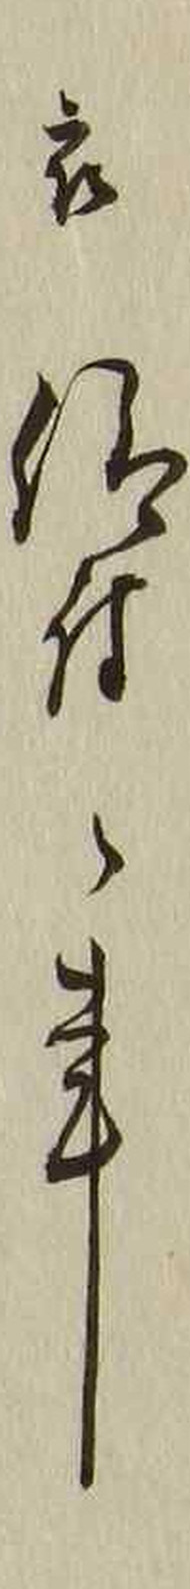被仰付候事
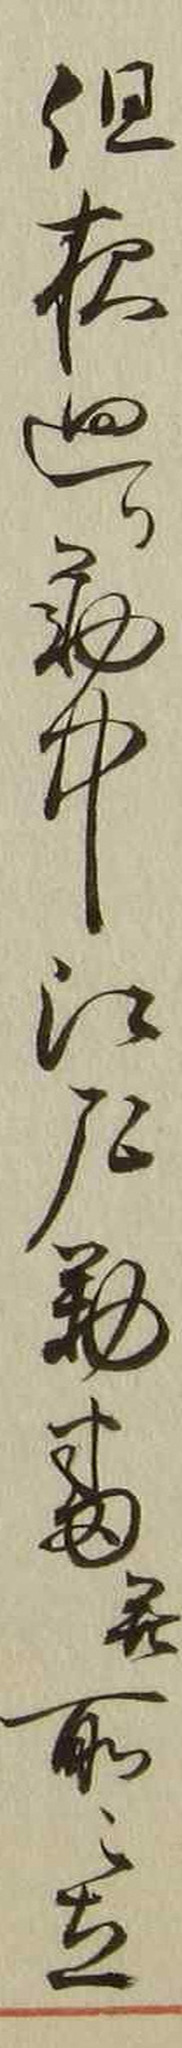但夜廻り勤中江戸勤番并所々立
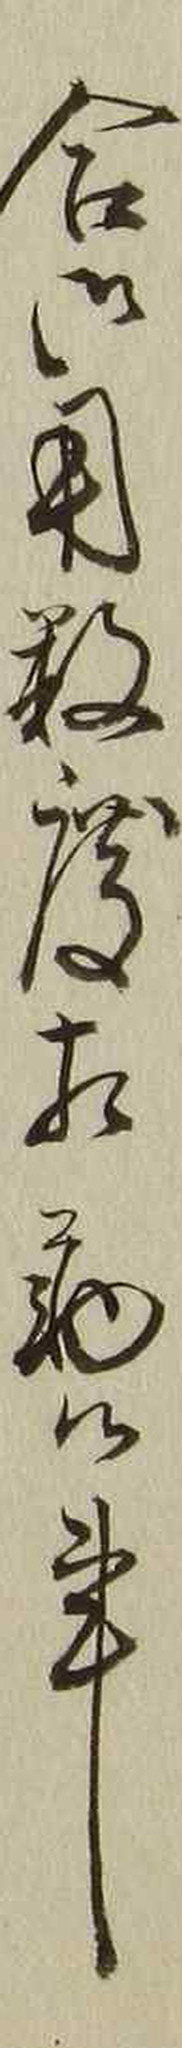合御用数度相勤候事
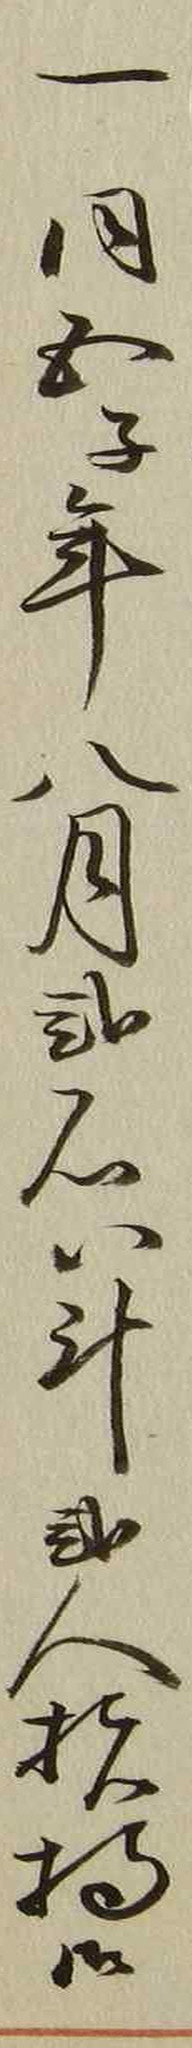一同五子年八月弐石八斗弐人扶持御
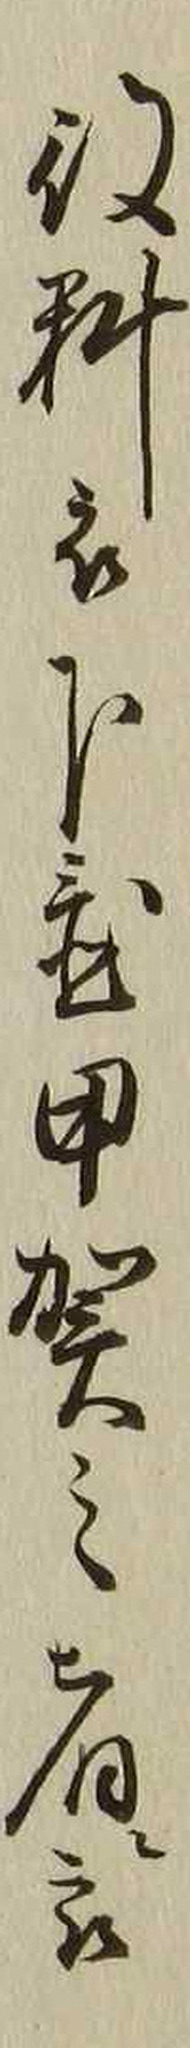役料被下置甲賀之者ニ被
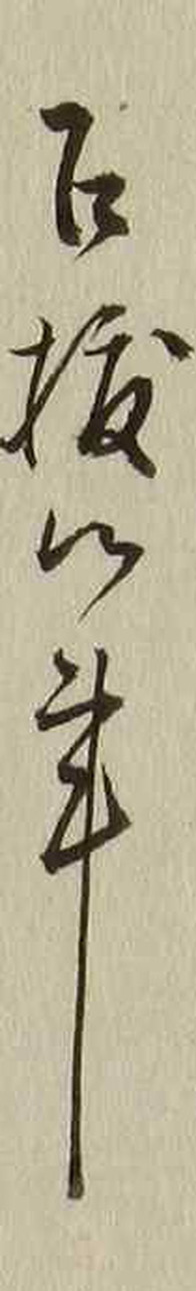召抜候事
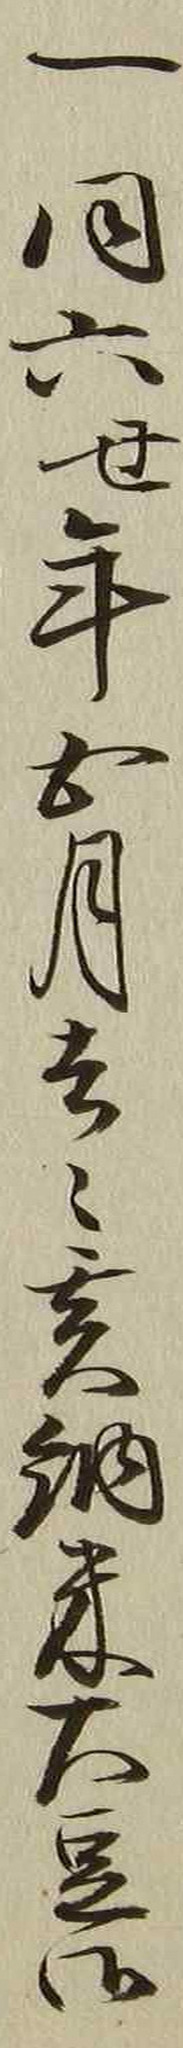一同六丑年五月去々亥納米大豆御
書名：諸士系譜　巻之57　ほ之部4
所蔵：会津若松市立会津図書館
